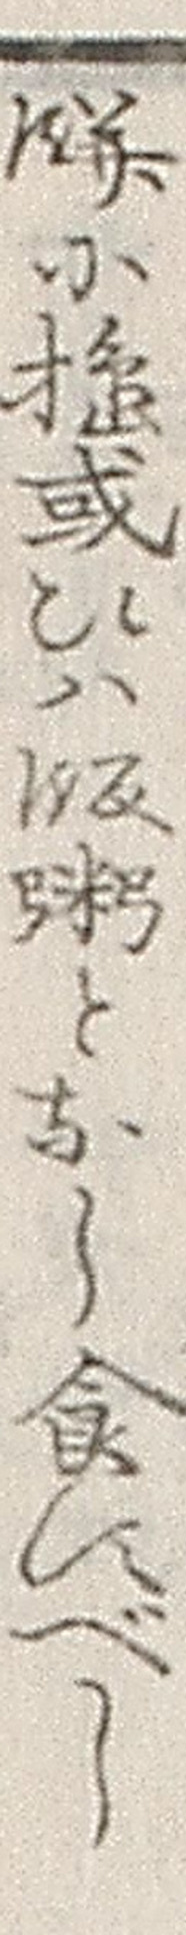餅に搗或いひは飯粥となし食すべし
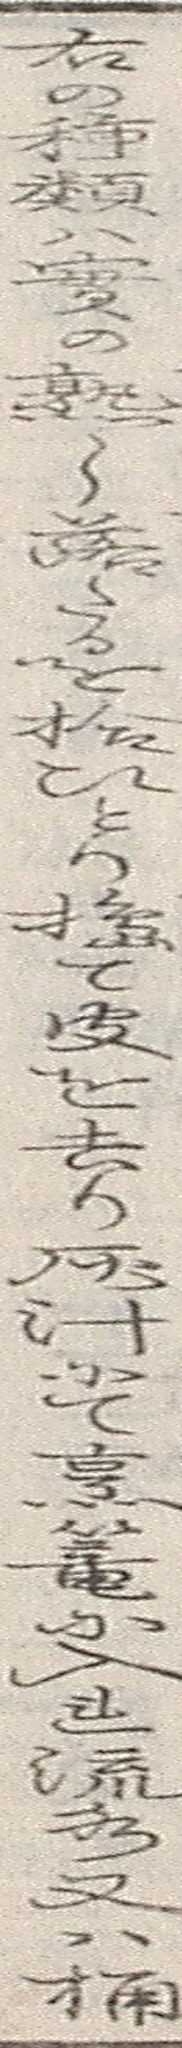右の種類は実の熟し落たるを拾ひとり搗て皮を去り灰汁にて烹篭に入れ流水又は桶
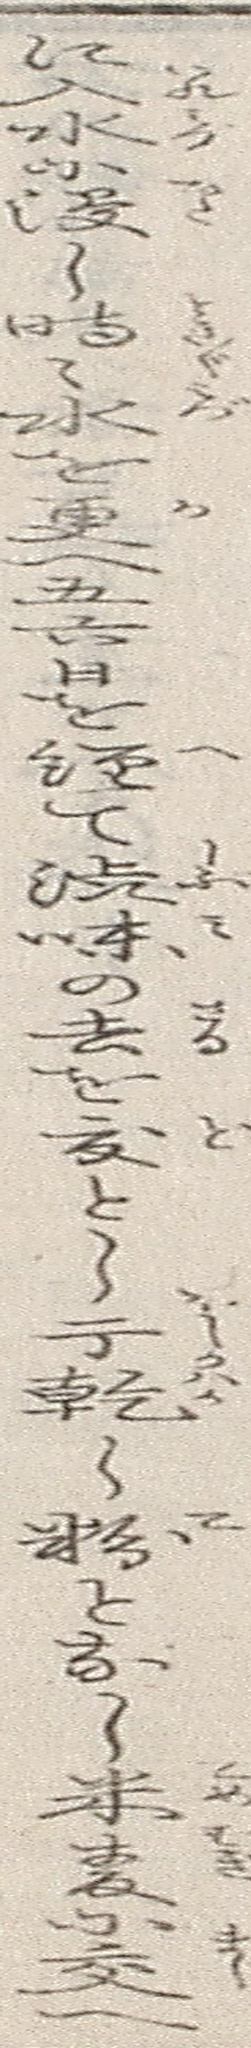に入水に浸し時々水を更へ五六日を経て渋味の去を度とし干乾し粉となし米麦に交へ
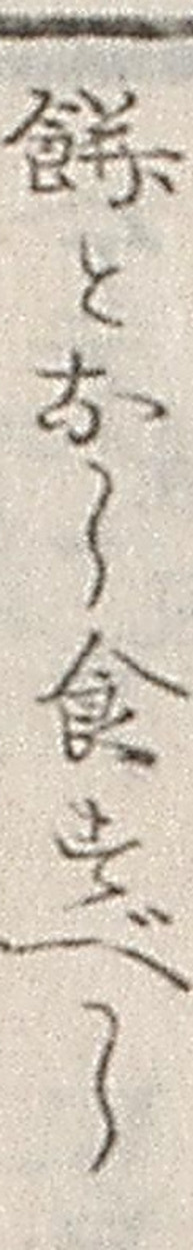餅となし食すべし
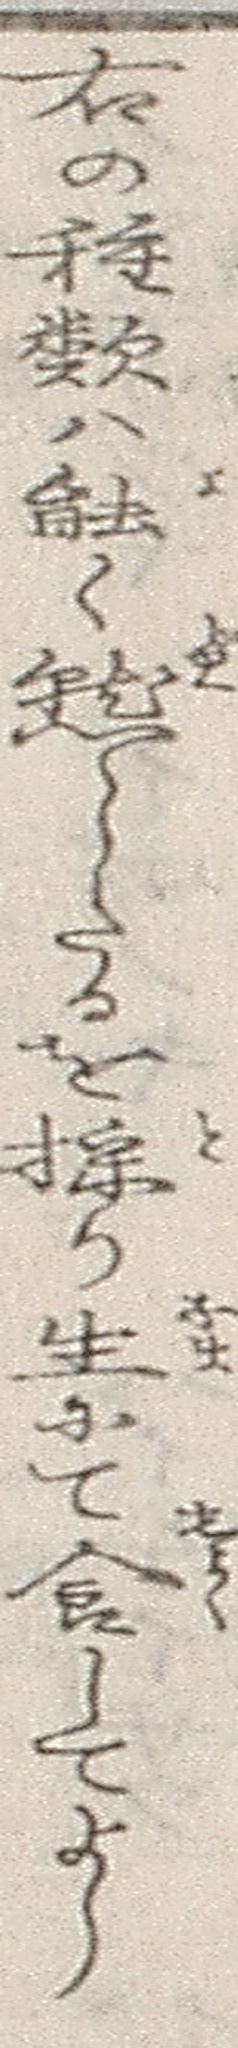右の種類は能く熟したるを採り生にて食してよし
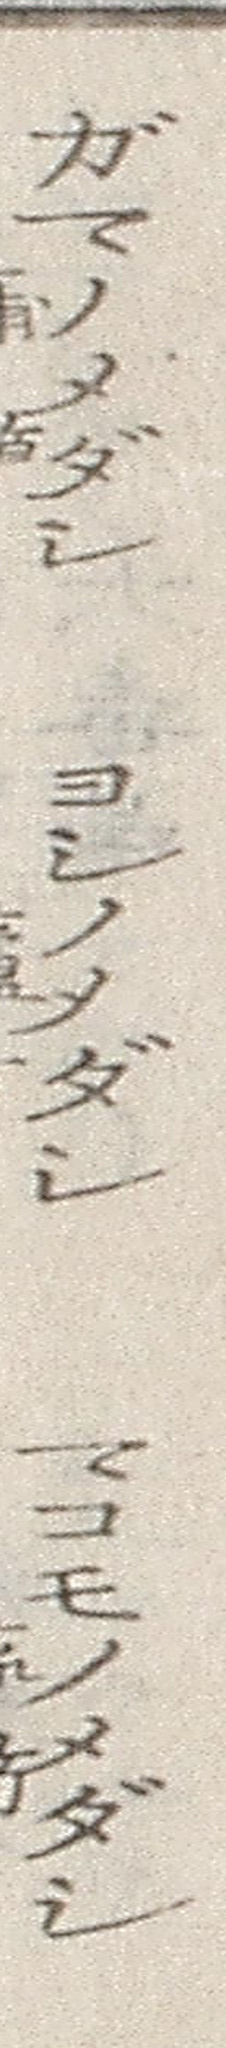ガマノメダシヨシノメダシマコモノメダシ
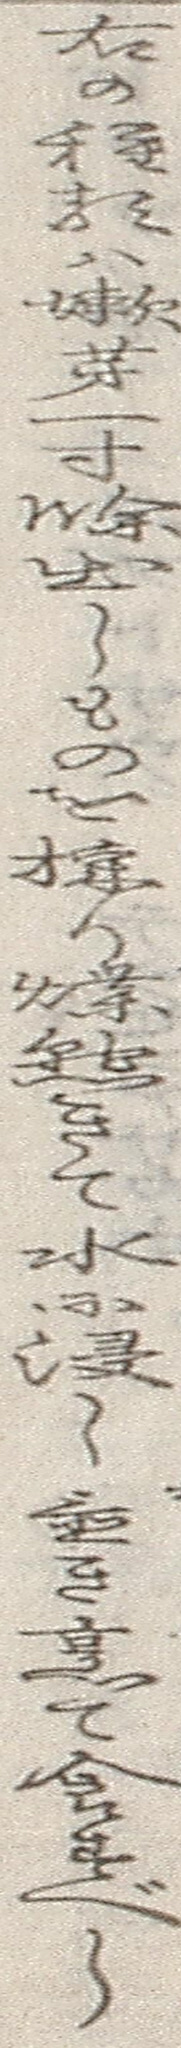右の種類は嫩芽一寸余出しものを採り煠熟きて水に浸し置き烹て食すべし
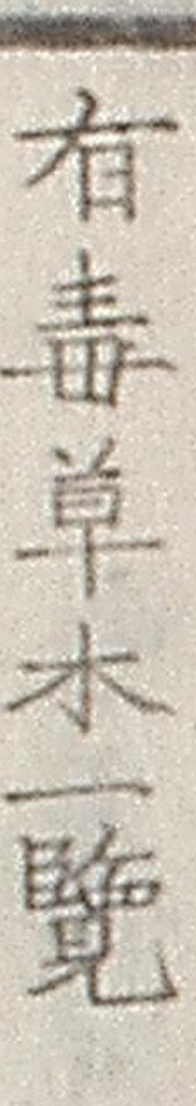有毒草木一覧
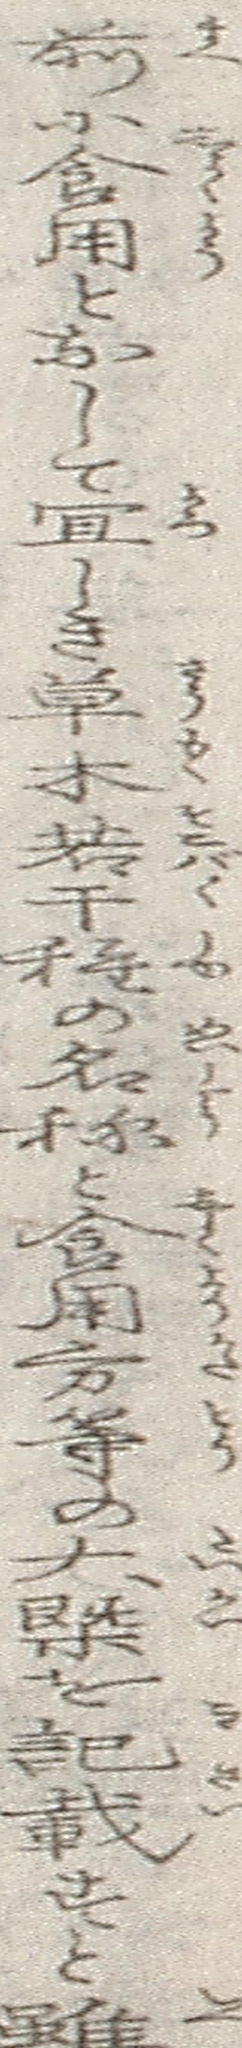前に食用となしてよ宜しき草木若干種の名称と食用方等の大概を記載すと雖
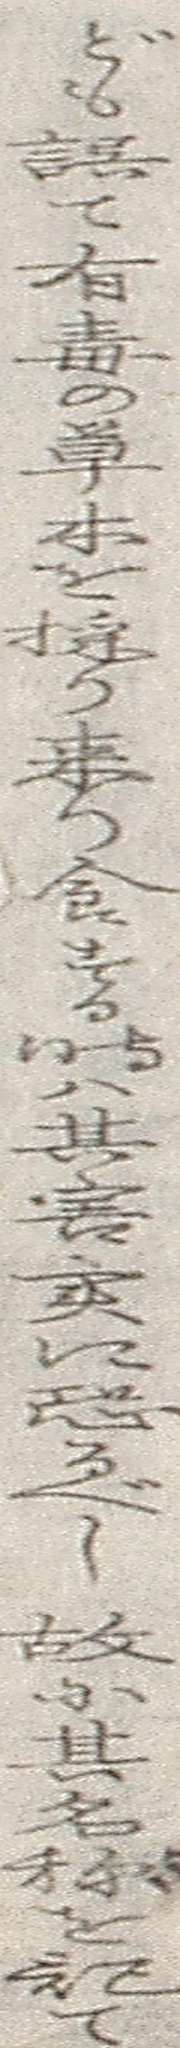ども誤て有毒の草木を採り来り食する時は其害実に恐るべし故に其名称を記て
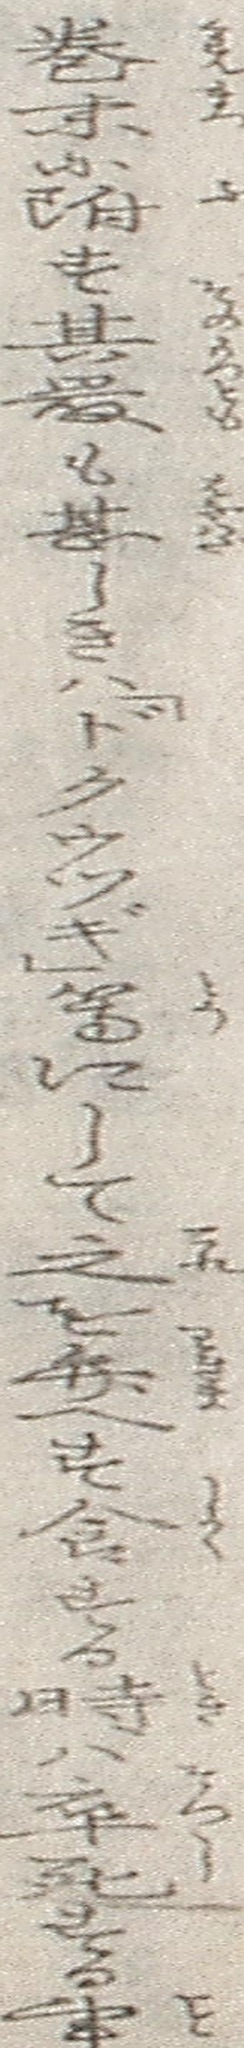巻末に附す其最も甚しきは「ドクウツギ」等にして之を弁へす食する時は卒死する事

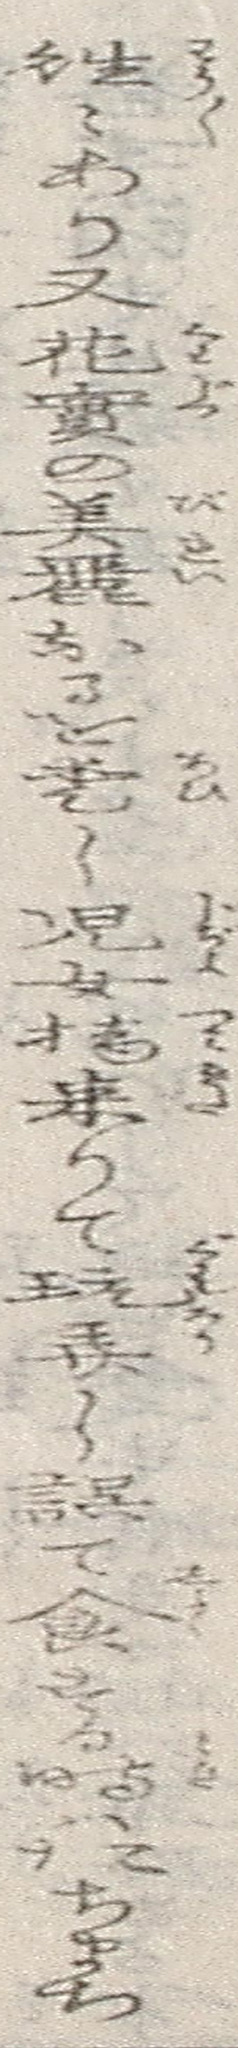往々あり又花実の美麗なるを愛し児女摘来りて玩弄し誤て食する時はたちまち
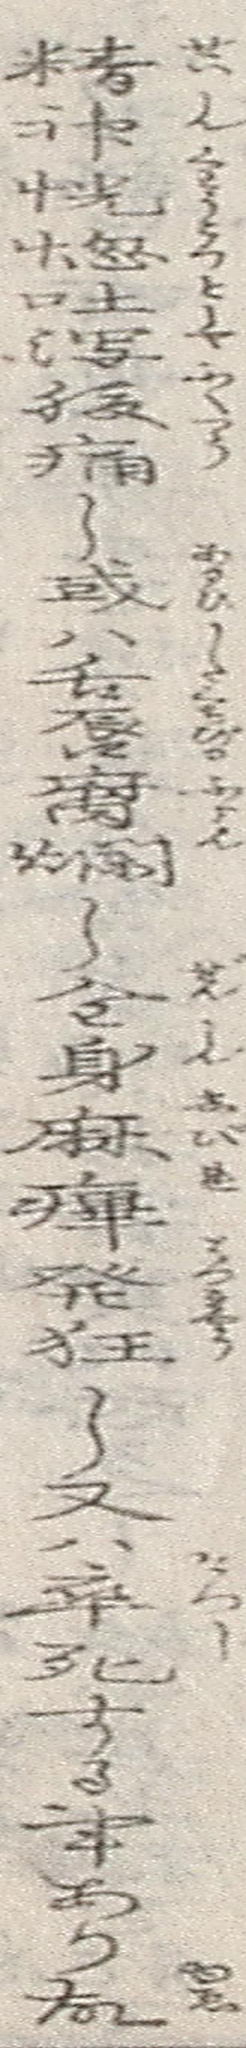精神恍惚吐瀉腹痛し或は舌唇腐爛し全身麻痺発狂し又は卒死する事あり故
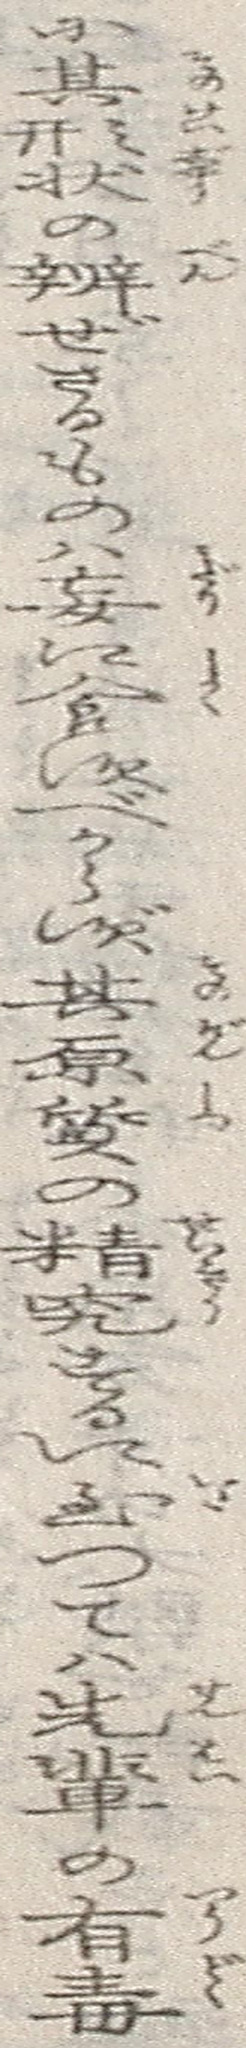に其形状の弁ぜざるものは妄に食すべからず其原質の精究するに至つては先輩の有毒
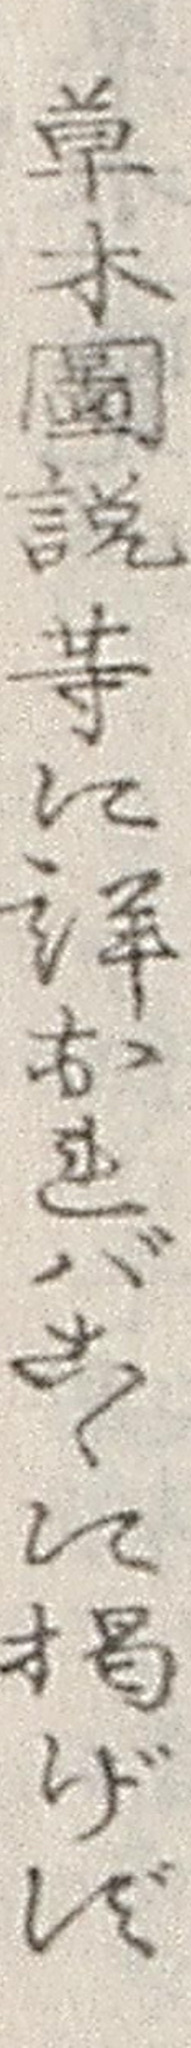草木図説等に詳なればこゝに掲げず
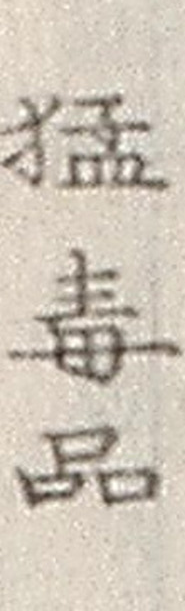猛毒品
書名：凶荒図録　完
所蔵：東京大学地震研究所図書室 Earthquake Research Institute Library, The University of Tokyo, JAPAN
